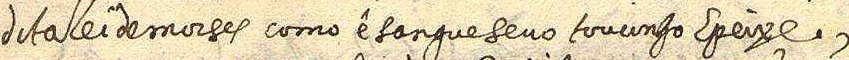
dita lei de moises como ê sangue seuo toucinho E peixe
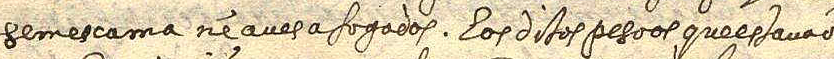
sem escama nē aues afogadas. E as ditas pesoas que estauaõ
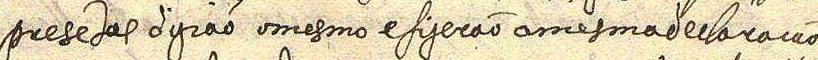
presētes diziaõ o mesmo e fizeraõ a mesma declaracaõ
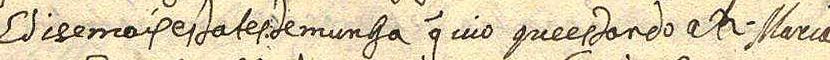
E dise mais esta testemunha q̄ uio que estando a R. Maria
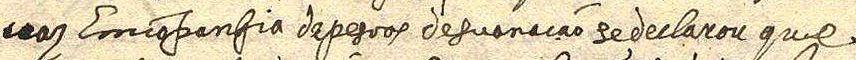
uaz Em cōpanhia de pesoas de sua nacaõ se declarou que
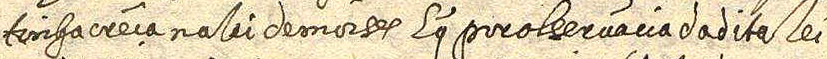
tinha crēça na lei de moises E q̄ por obseruāçia da dita lei
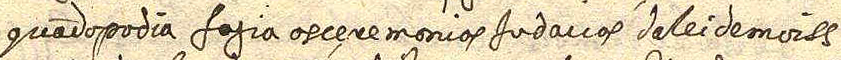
quādo podia fazia as çeremonias Judaicas da lei de moises
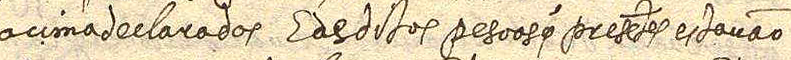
açima declaradas E as ditas pesoas q̄ presētes estauaõ
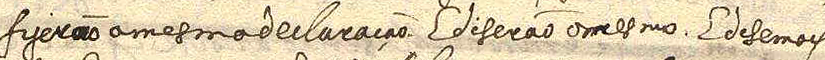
fizeraõ a mesma declaraçaõ E diseraõ o mesmo. E dise mais
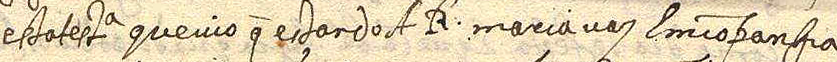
esta testa que uio q̄ estando A R. maria uaz Em c̄opanhia
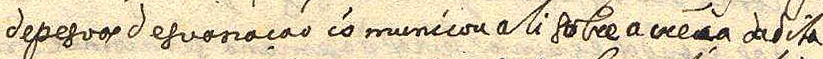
de pesoas de sua naçaõ cōmunicou ali sobre a crēça da dita
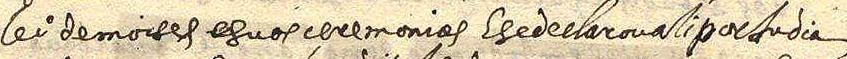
lei de moises e suas çeremonias E se declarou ali por Iudia
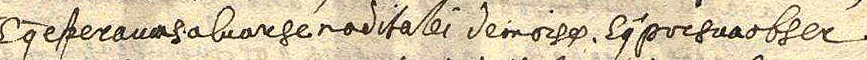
E q̄ esperaua saluarse na dita lei de moises. E q̄ por sua obser
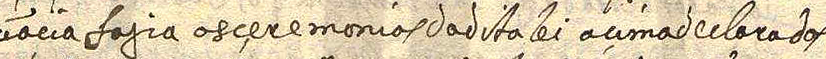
uāçia fazia as çeremonias da dita lei açima declaradas
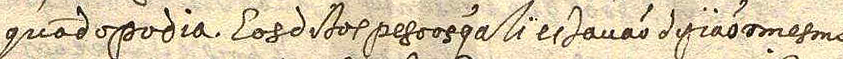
quādo podia. E as ditas pesoas q̄ ali estauaõ diziaõ o mesmo
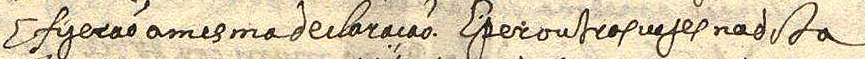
E fizeraõ a mesma declaraçaõ. E per outras ueses na dita
